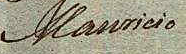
Mauricio?
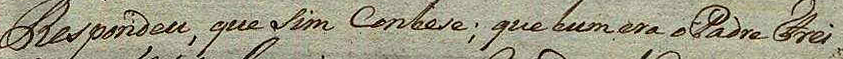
Respondeu, que sim conhece; que hum era o Padre Frei
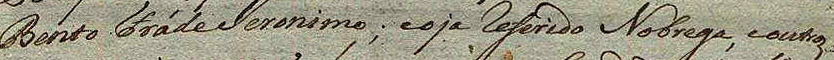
Bento Fráde Jeronimo; e o ja Referido Nobrega, e outroz,
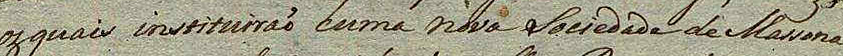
oz quais instituiraõ huma nova Sociedade de Massona
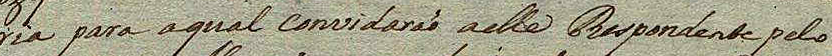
ria para a qual convidaraõ a elle Respondente pelo
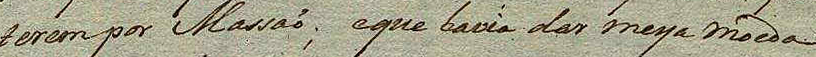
terem por Massaõ; e que havia dar meya moeda
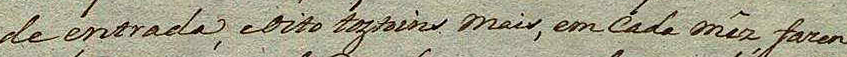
de entrada, e oito toztoins mais, em cada mêz, fazen
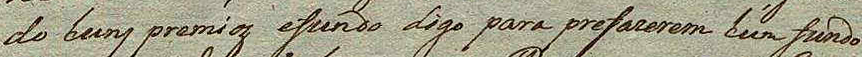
do huns premioz e fundo digo para prefazerem hum fundo
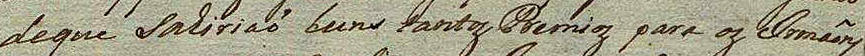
de que sahiriaõ huns tantoz Premioz para oz Irmaõns
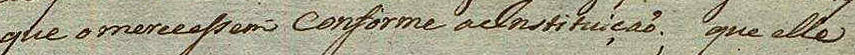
que o merecessem conforme a Instituiçaõ; que elle
